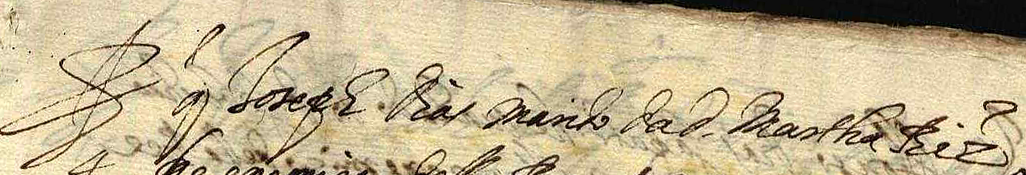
Ꝓ 4 q̄ Ioseph Dias marido da d. Martha Riz̄
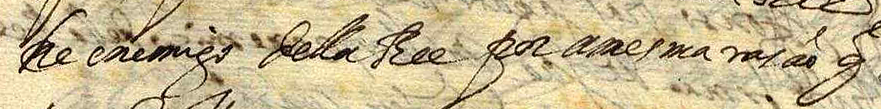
he enimigo della Ree por a mesma rasaõ q̄
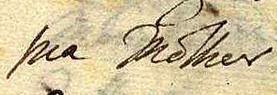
sua molher
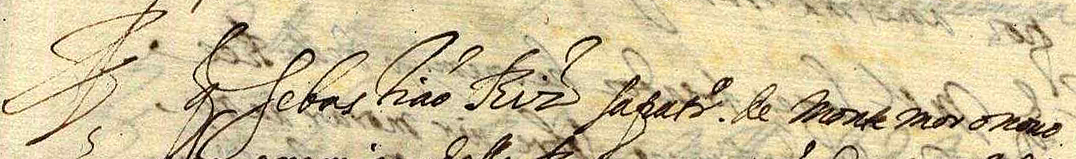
Ꝓ 5 q̄ sebastiaõ Riz̄ sapatr.o de montemor o nouo
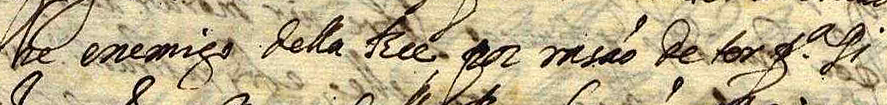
he enemigo della Ree, por rasaõ de ter ꝑ.a si
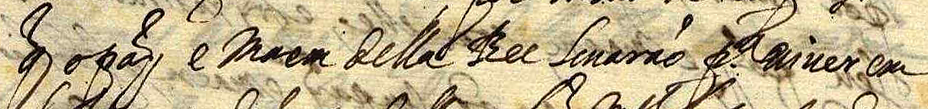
q̄ o pay e maem della Ree leuaraõ ꝑ.a uiuer em
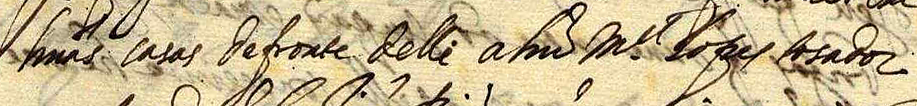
huās casas defronte delle a hū m.el lopes tosador
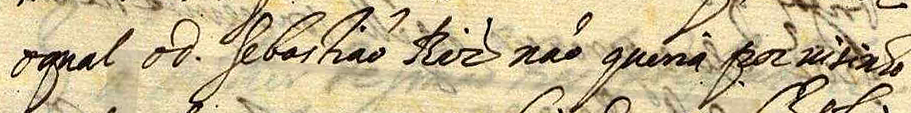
o qual o d. sebastiaõ Riz̄ naõ queria por uisinho
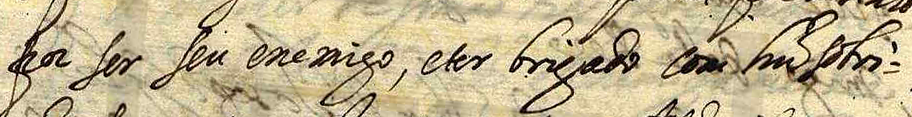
por ser seu enemigo, e ter brigado com hū sobri
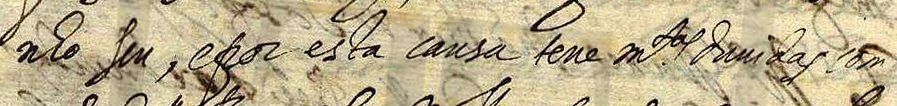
nho seu, e por esta causa teue m.tas duuidas com
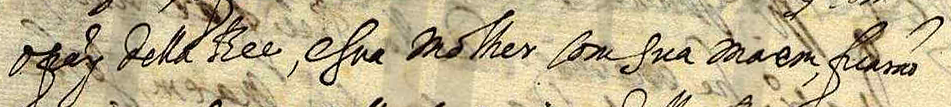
o pay della Ree, e sua molher com sua maem, ficaraõ
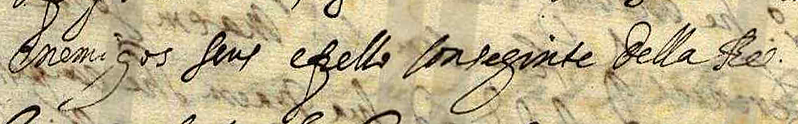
enemigos seus e pello conseginte della Ree.
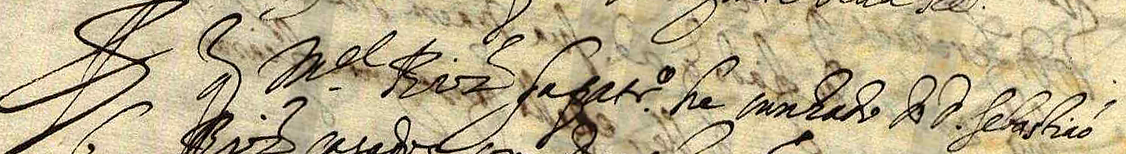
Ꝓ 6 q̄ M.el Riz̄ Sapatr.o he cunhado do d. sebastiaõ
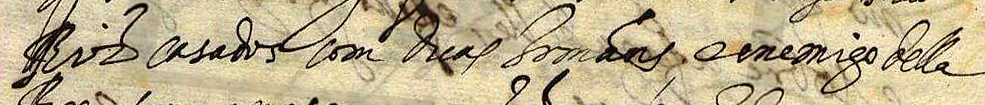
Riz̄ casados com duas Irman̄s, e enemigo della
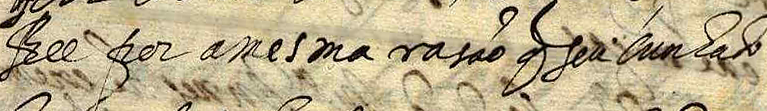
Ree por a mesma rasaõ q̄ seu cunhado
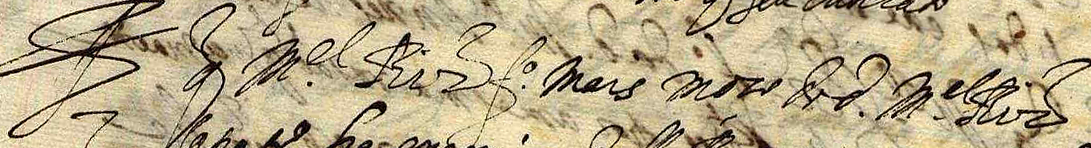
Ꝓ 7 q̄ M.el Riz̄ f.o mais moso do d. M.el Riz̄
